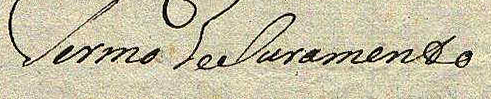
Termo de Iuramento
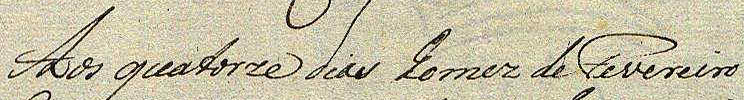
Aos quatorze dias do mez de Fevereiro
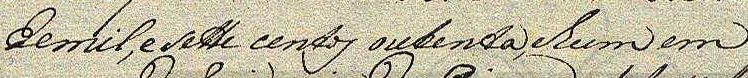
de mil e settecentos outenta, e hum em
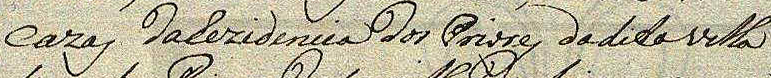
cazas da Rezidencia dos Priores da dita villa
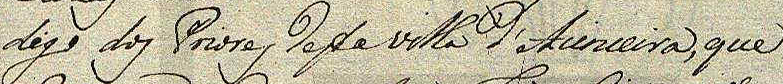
digo dos Priores desta villa d'Acinceira, que
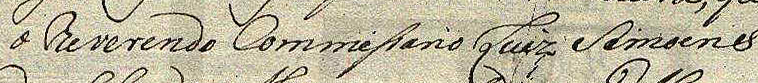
o Reverendo Commissario Luiz Simoens
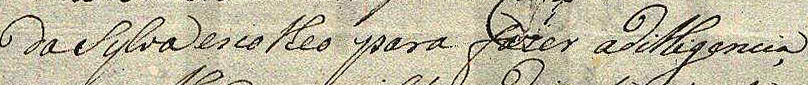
da Sylva escolheo para fazer a dilligencia
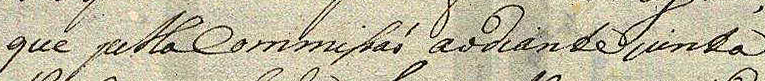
que pella Commissaõ aodiante junta
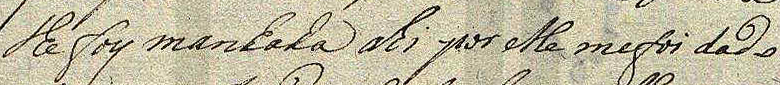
lhe foy mandada ahi por elle me foi dado
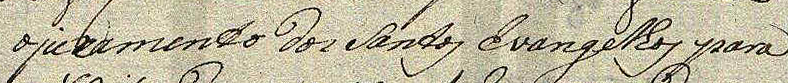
o juramento dos Santos Evangelhos para
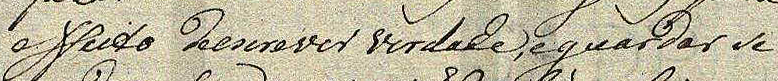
effeito de escrever verdade, e guardar se
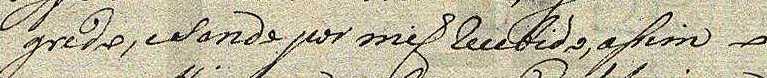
gredo, e sendo por mī Recebido, assim o
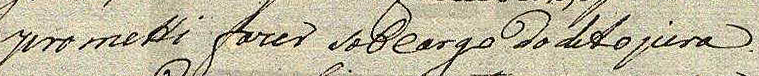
prometti fazer sob cargo do dito jura
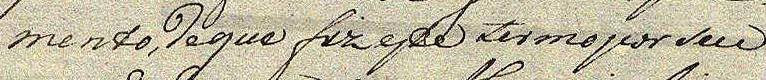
mento, de que fiz este termo por seu
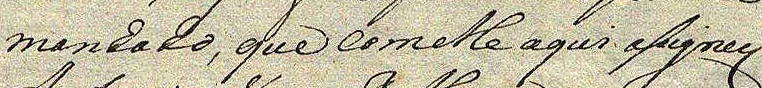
mandado, que com elle aqui assigney
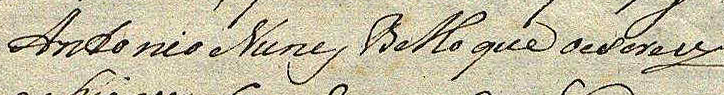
Antonio Nunes Bello que o escrevj
